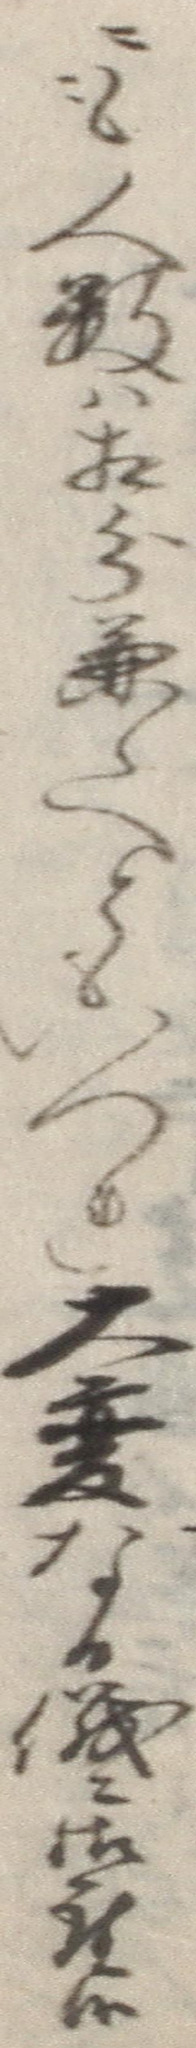ニも人数ハ相分兼候得共いつれ大変なる儀ニ御座候
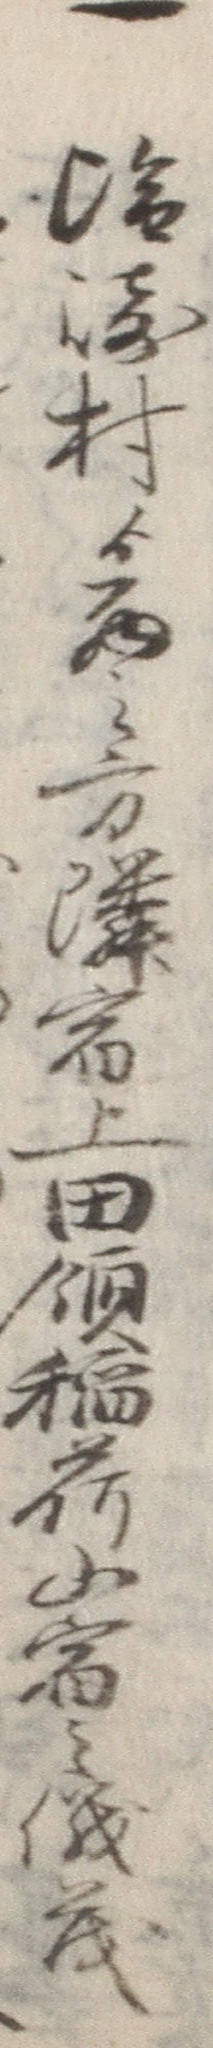塩崎村ゟ西之方隣宿上田領稲荷山宿之儀も
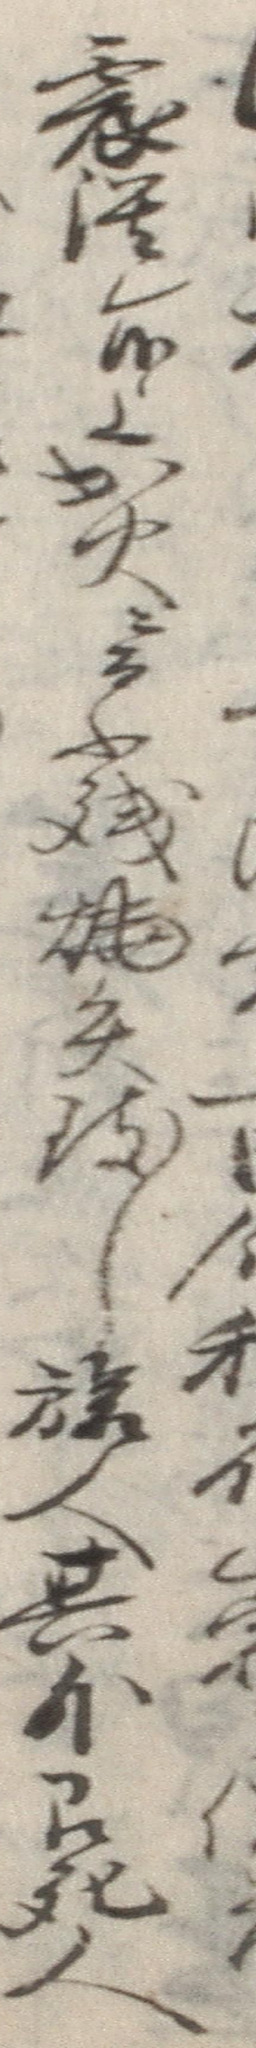震潰レ候上出火ニ而不残焼失致し旅人其外即死人
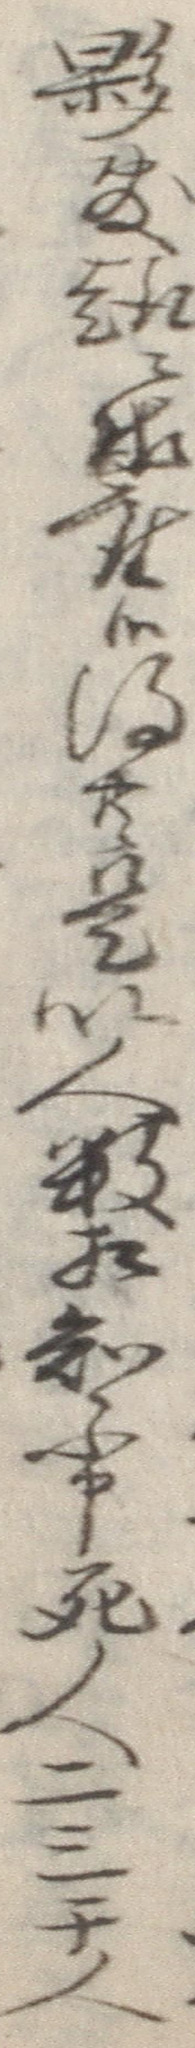夥敷趣ニ御座候得共是以人数相知不申死人二三千人
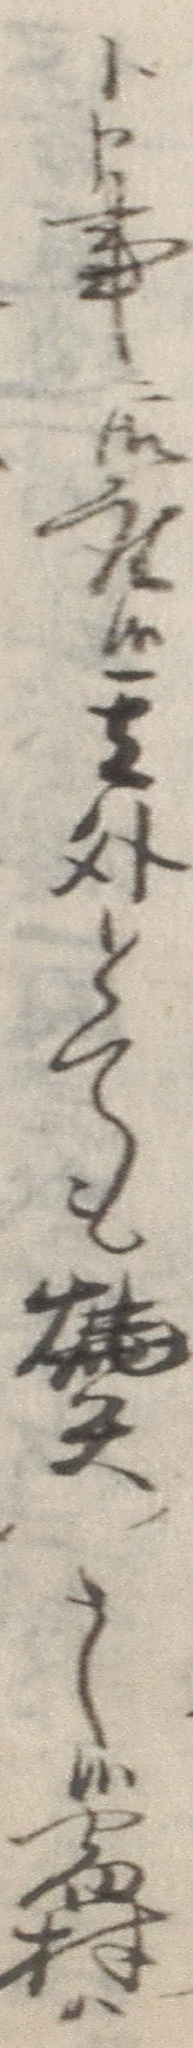ト申事ニ御座候其外とても焼失いたし候宿村ハ
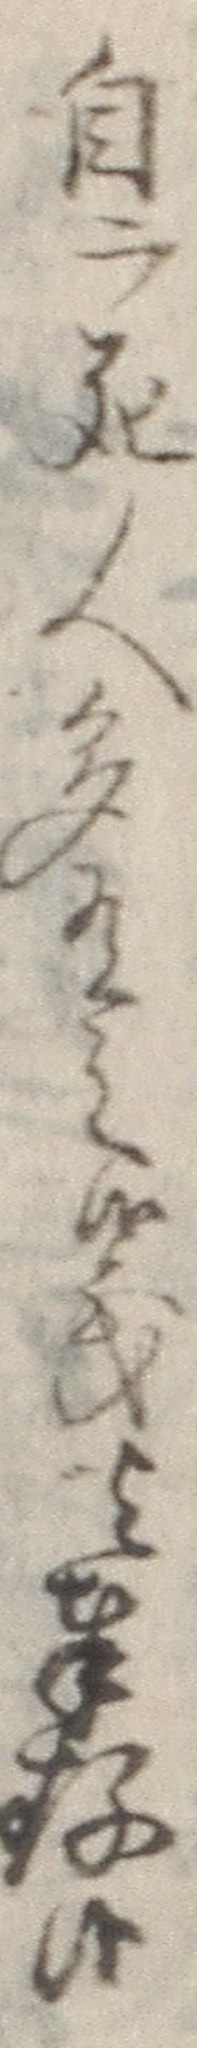自ラ死人多有之候義と奉存候
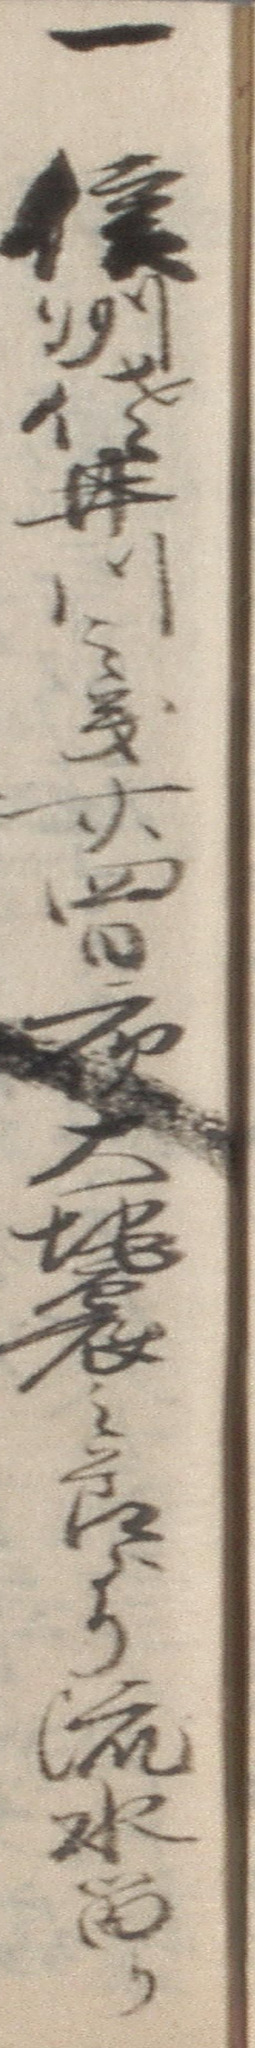一信州佐井川之之義廿日夜大地震之節より流水溜り
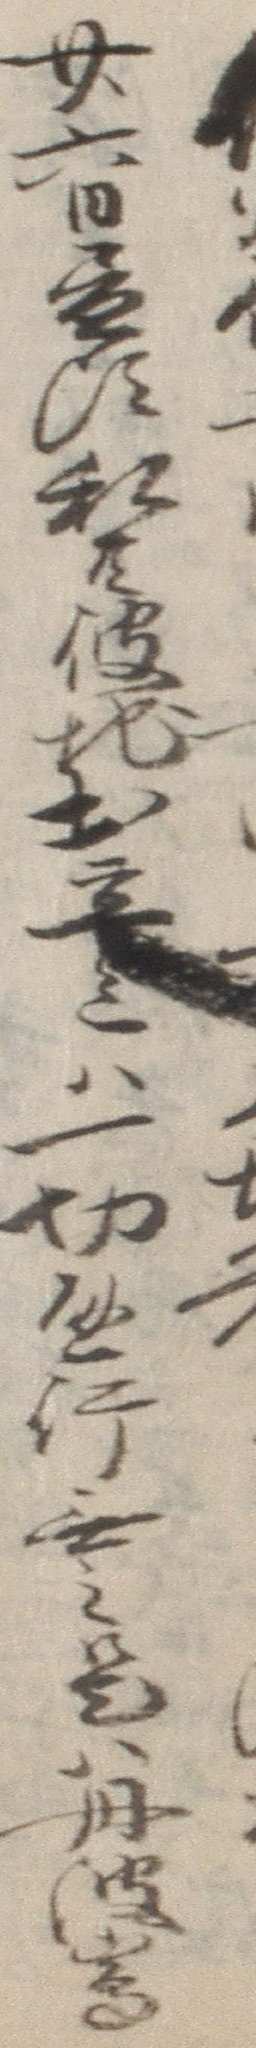廿六日昼頃私共彼地出立迄ハ一切通行無之是ハ丹波嶋
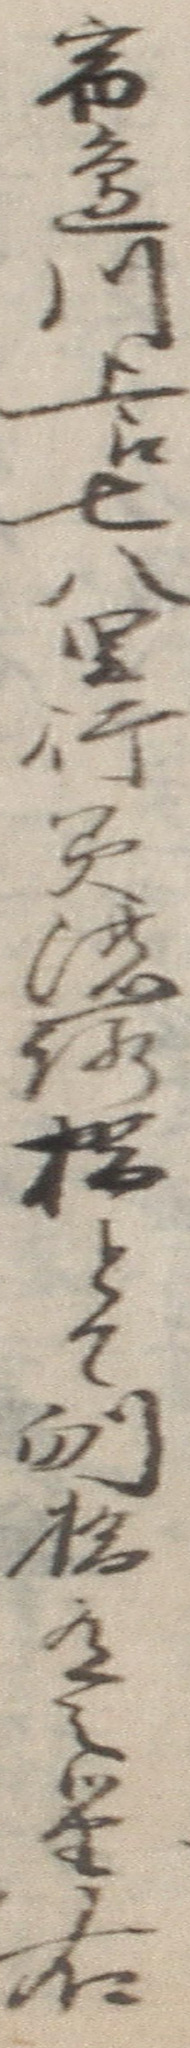宿辺川上え七八里行美濃路橋とて刎橋有之御座候右
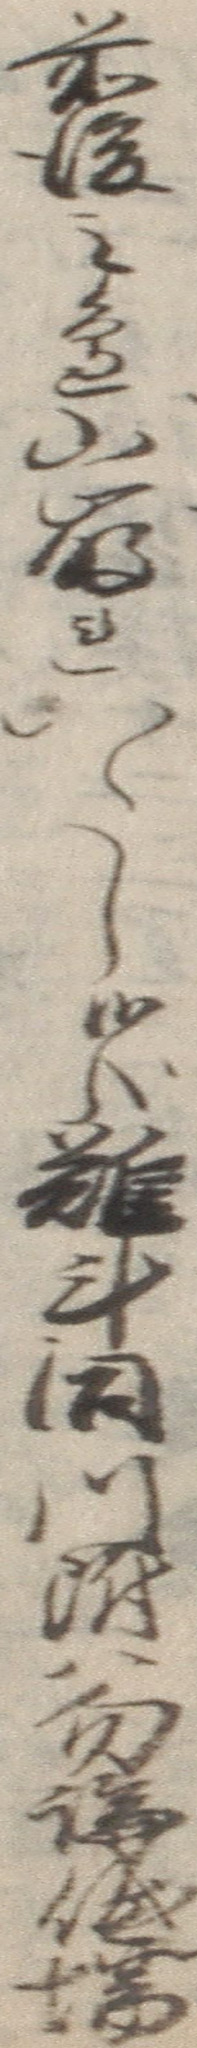前後之辺山崩れいたし候哉難斗同川附ハ勿論低場
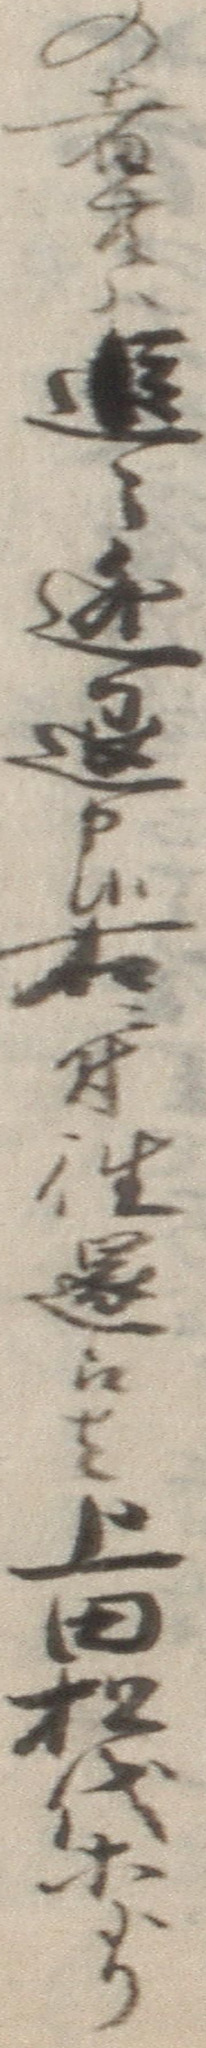の者共ハ追々逃退申候右ニ付往還えは上田松代等より
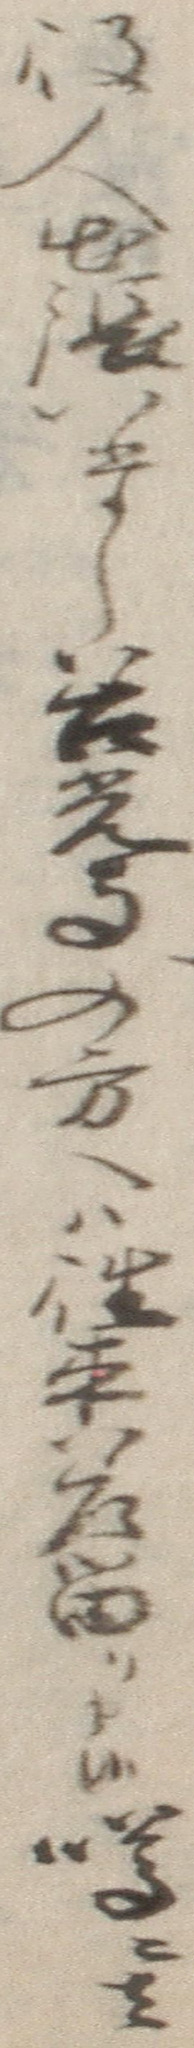役人出張いたし善光寺の方へハ往平ハ差留り申候噂ニは
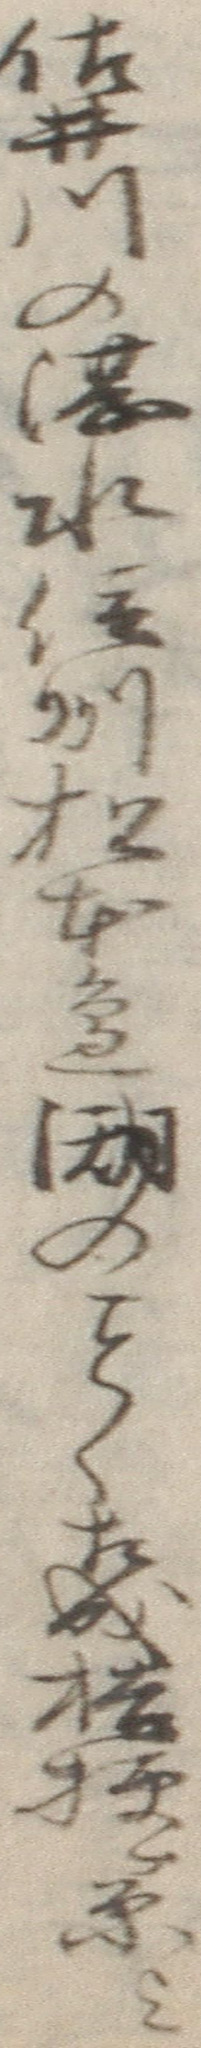佐井川の湛水信州松本辺湖のことく相成桔梗ケ原と
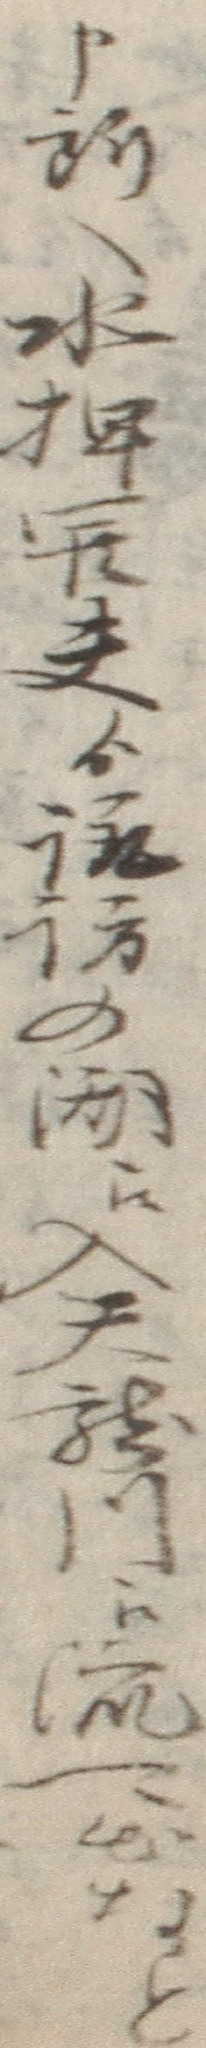申所へ水押開夫ゟ諏訪の湖え入天竜川え流れ可出なと
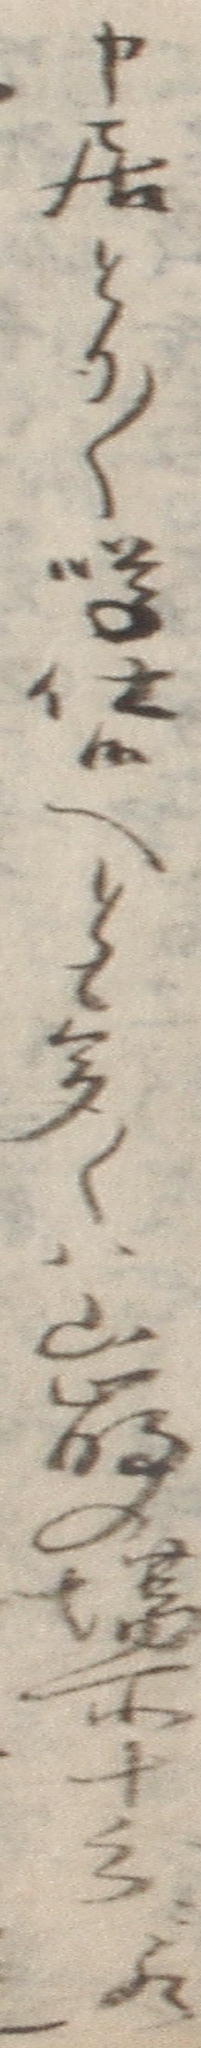申居とり〳〵噂仕候へとも多くハ山崩の場所十分ニ水
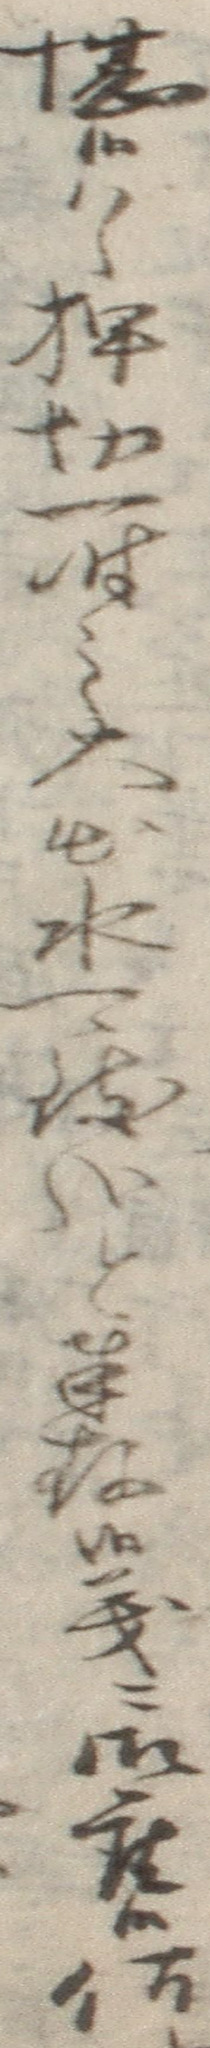堪候ハヽ押切一時之大出水可致哉と奉存候義に御座候何レ
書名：[善光寺地震に関する冊子]
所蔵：東京大学地震研究所図書室 Earthquake Research Institute Library, The University of Tokyo, JAPAN
